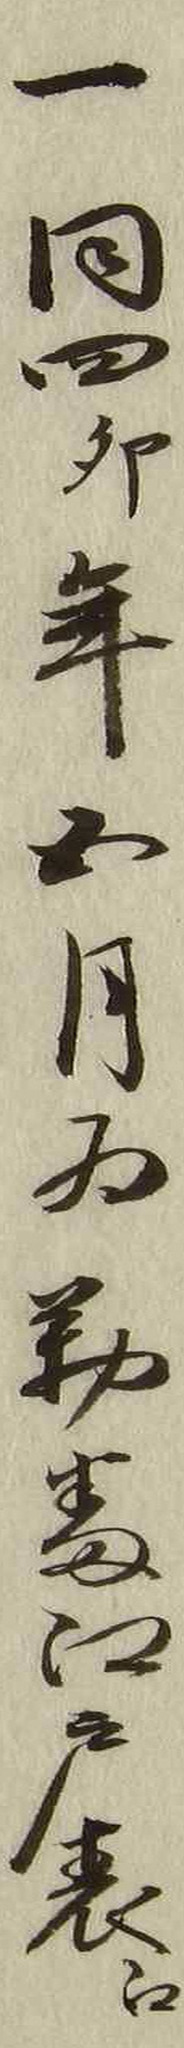一同四卯年五月為勤番江戸表江
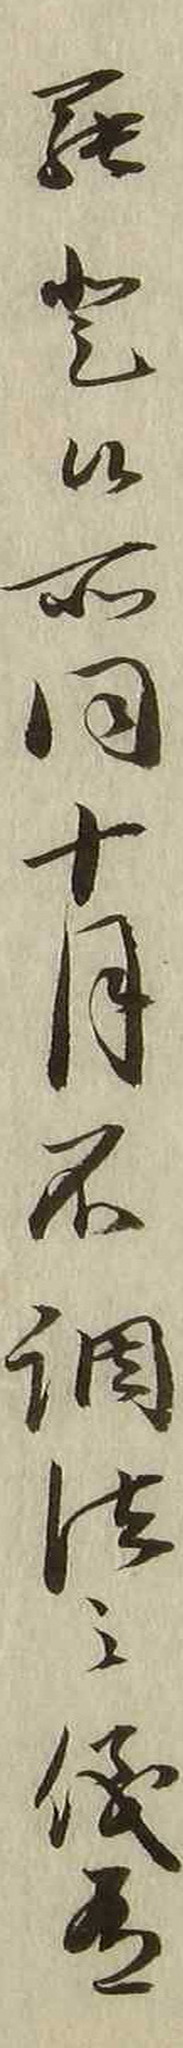罷登候所同十月不調法之儀有
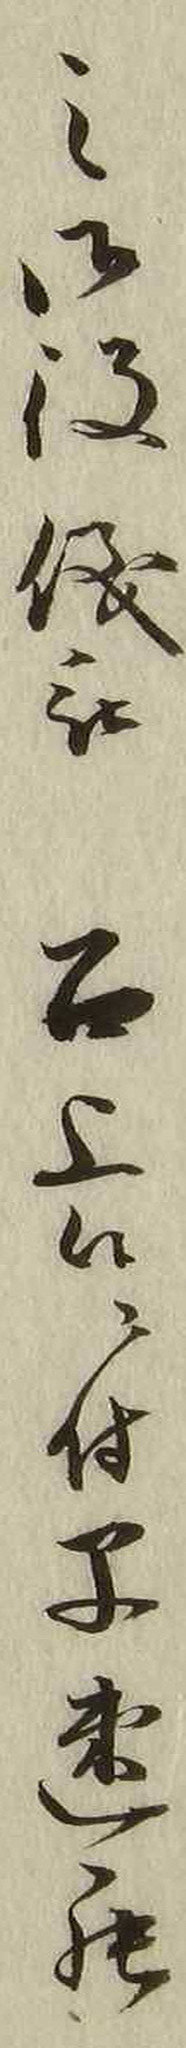之御役儀被召上候ニ付早速罷
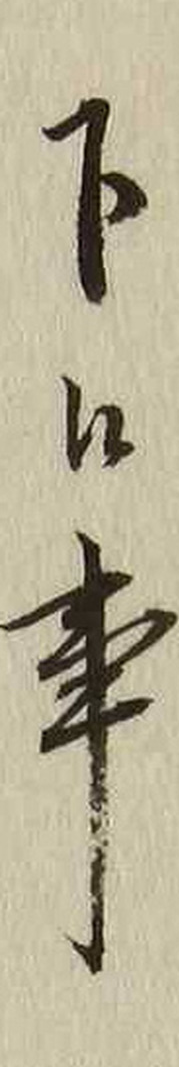下候事
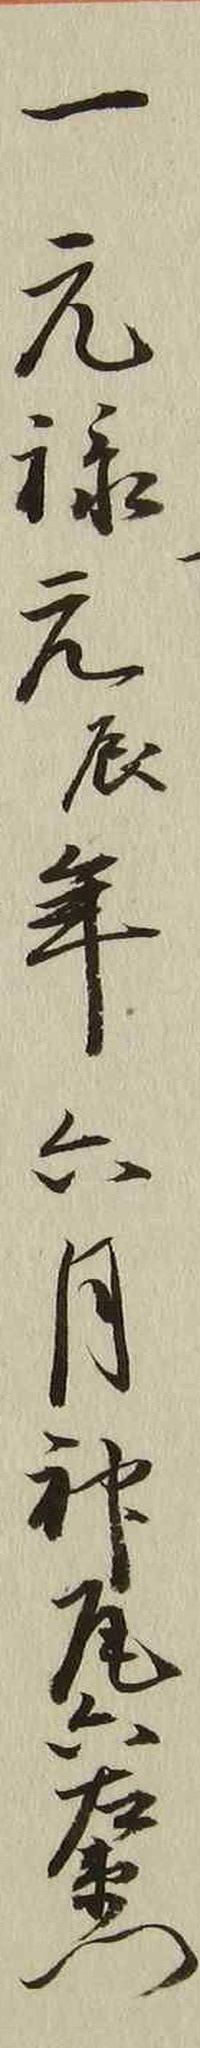一元禄元辰年六月神尾六右衛門
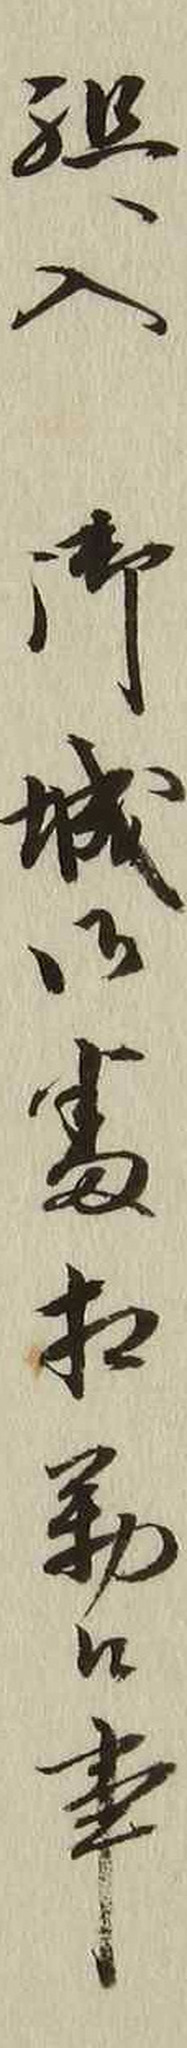組へ入御城御番相勤候事
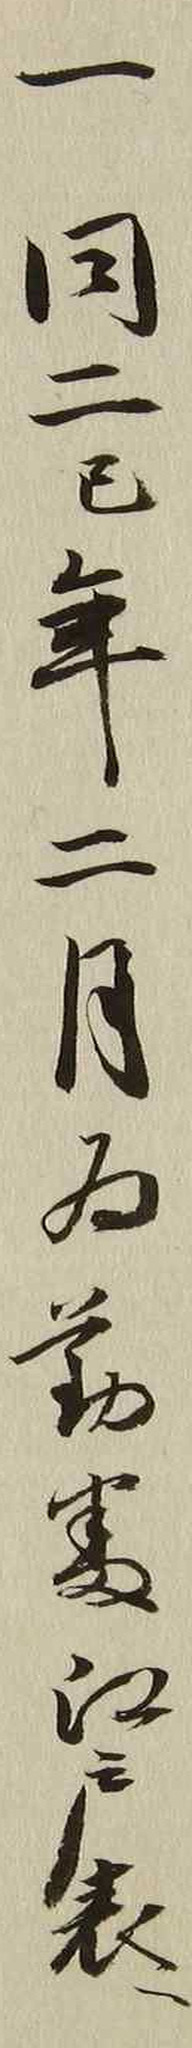一同二巳年二月為勤番江戸表へ
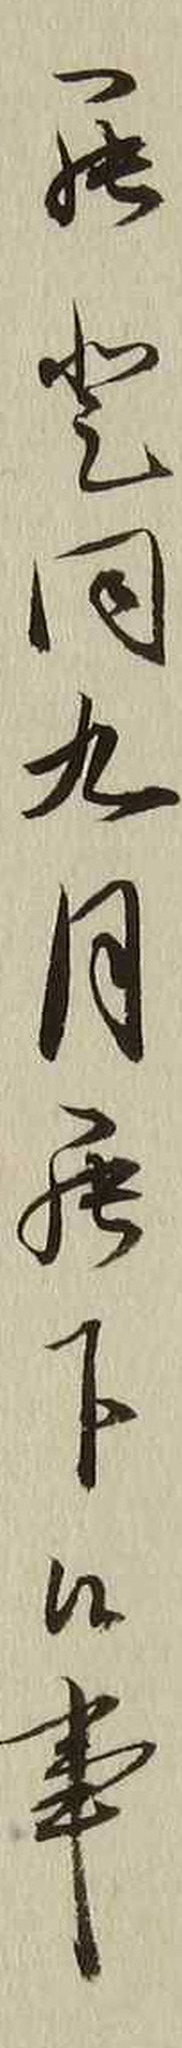罷登同九月罷下候事
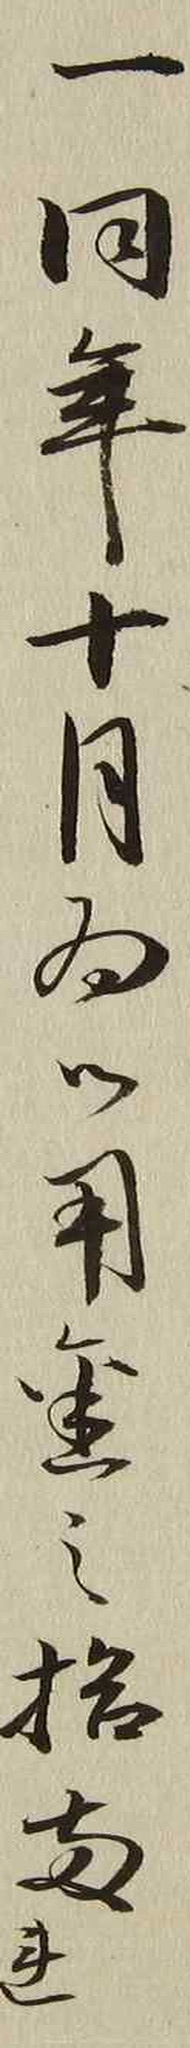一同年十月為御用金之拾両連
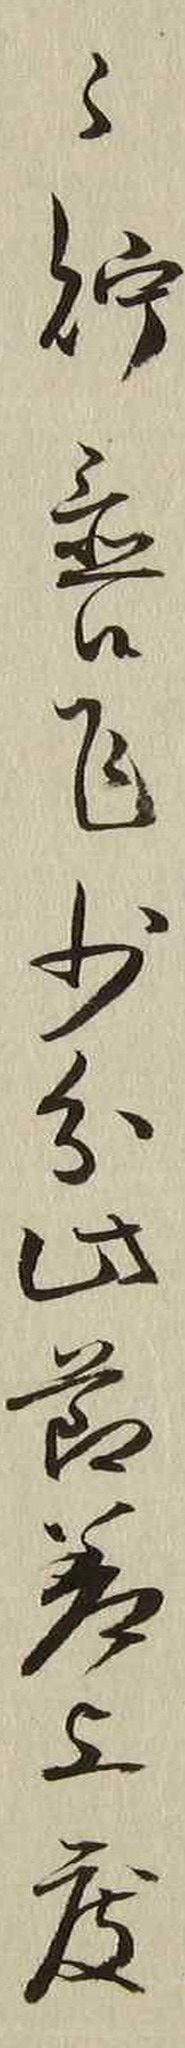々貯置候乍少分此節差上度
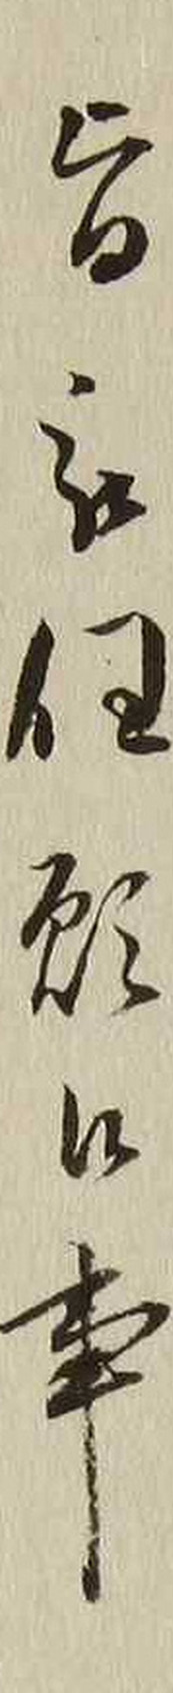旨被任願候事
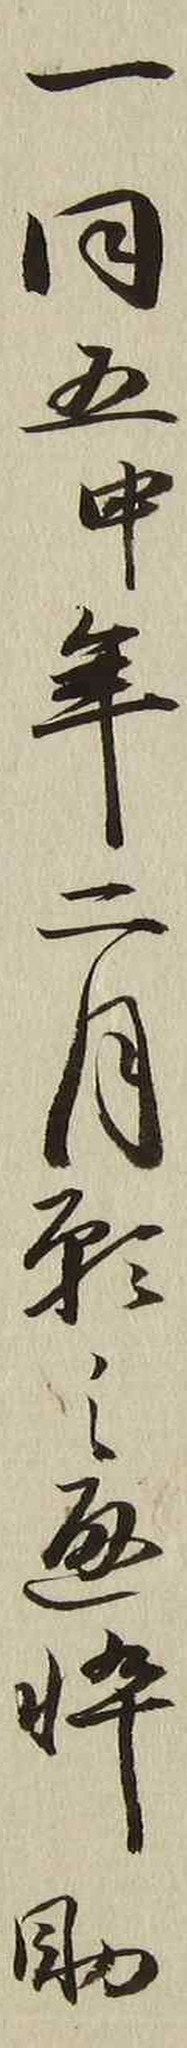一同五申年二月願之通忰助
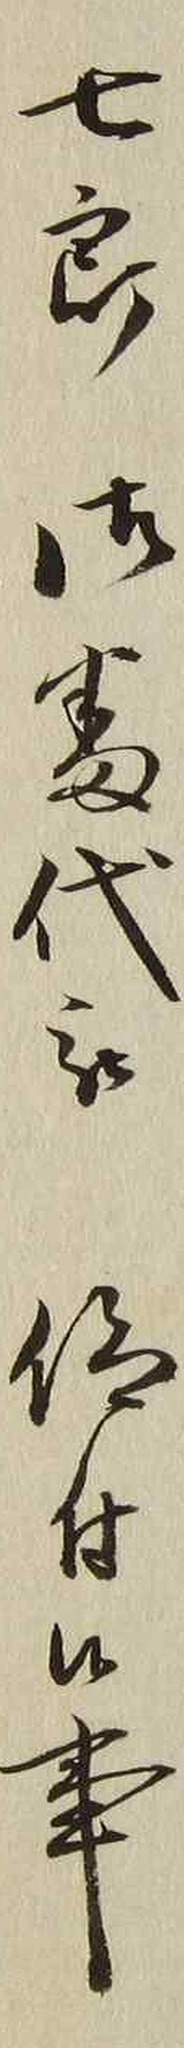七郎御番代被仰付候事
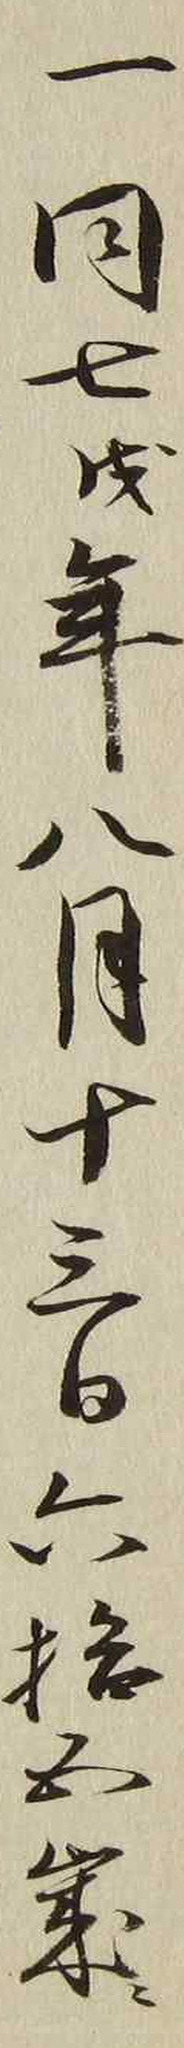一同七戌年八月十三日六拾五歳ニ
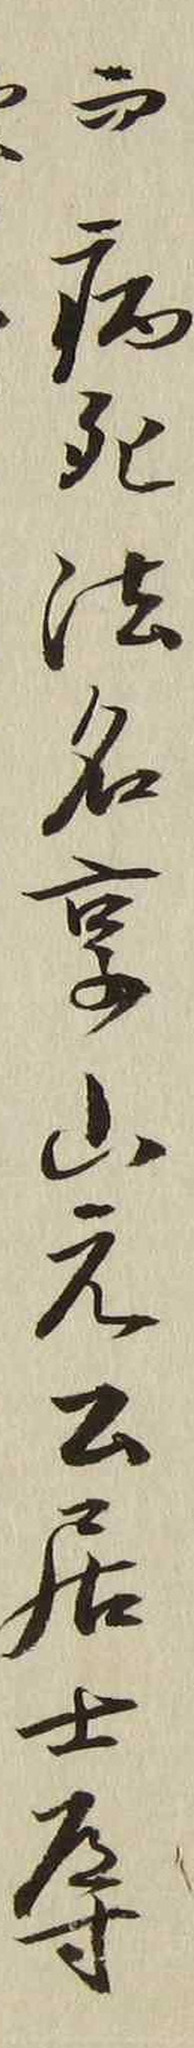而病死法名享山元公居士導
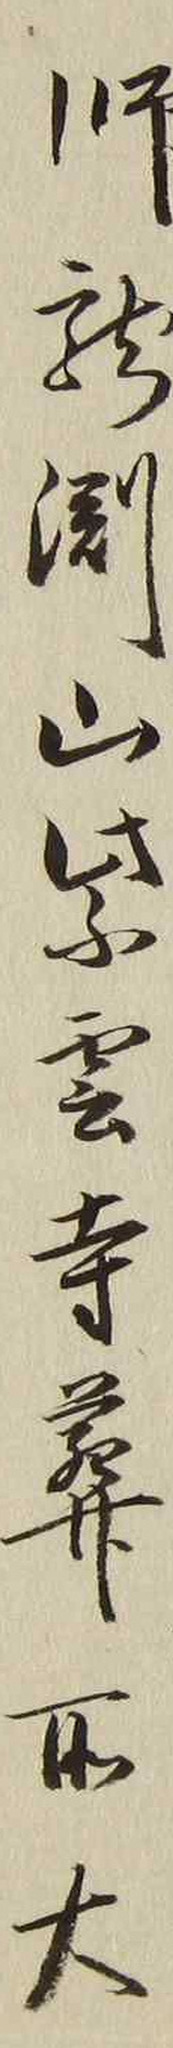師龍淵山紫雲寺葬所大
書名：諸士系譜　巻之61　と之部4
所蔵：会津若松市立会津図書館
